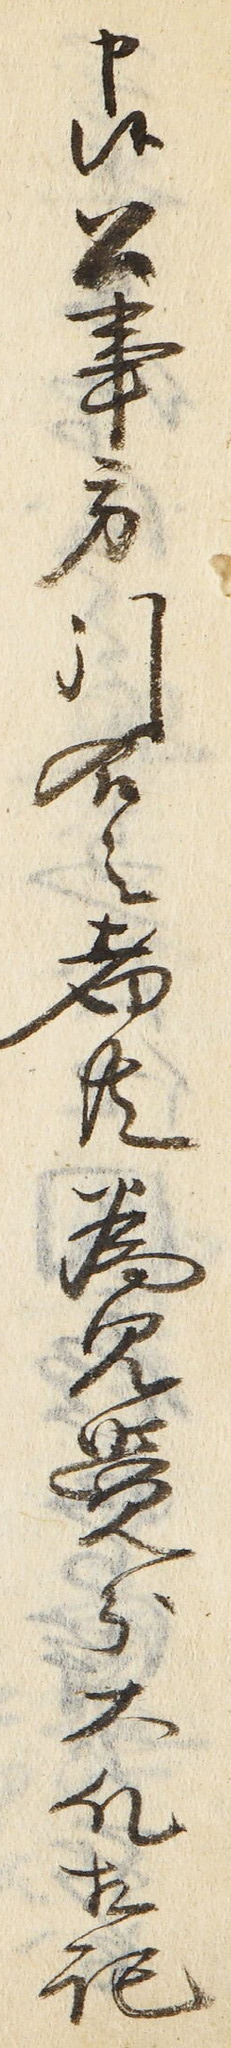申候公事方引合之者共為見覧分大凡左記
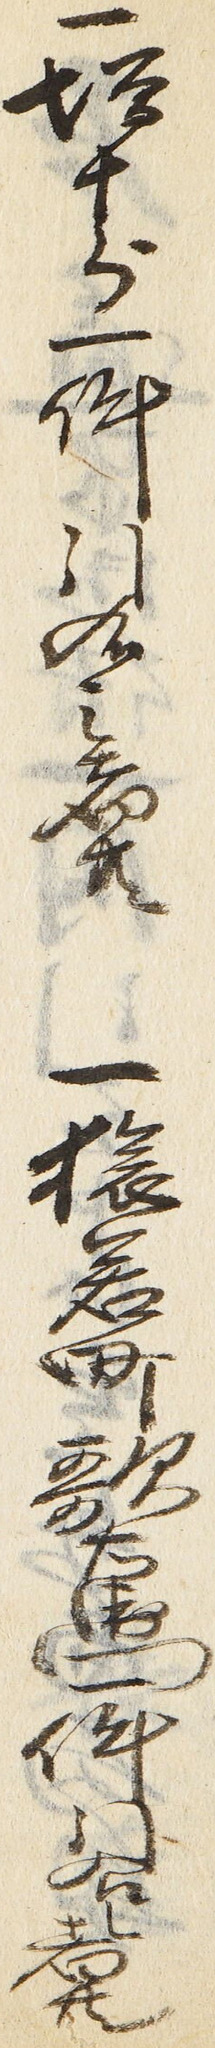一増十郎一件引合之者共一猿若町歌右衛門一件引合之者共
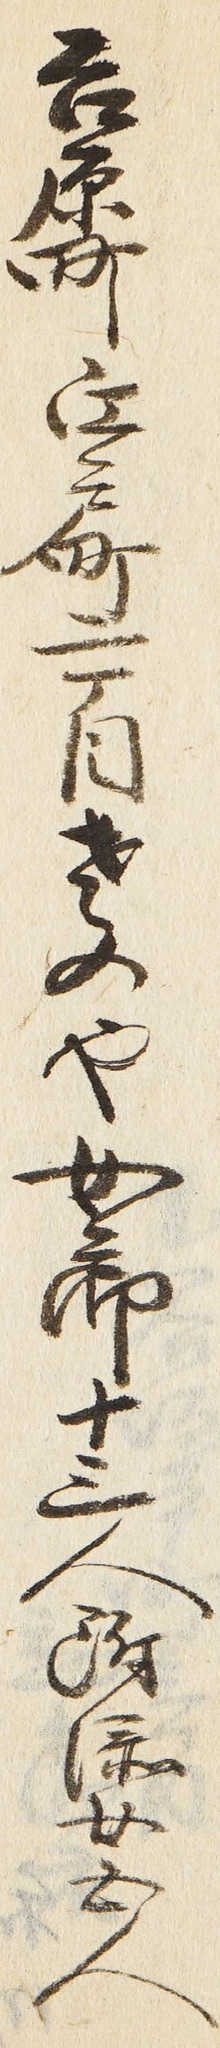吉原町江戸町二丁目さのや女郎十三人附添女五人
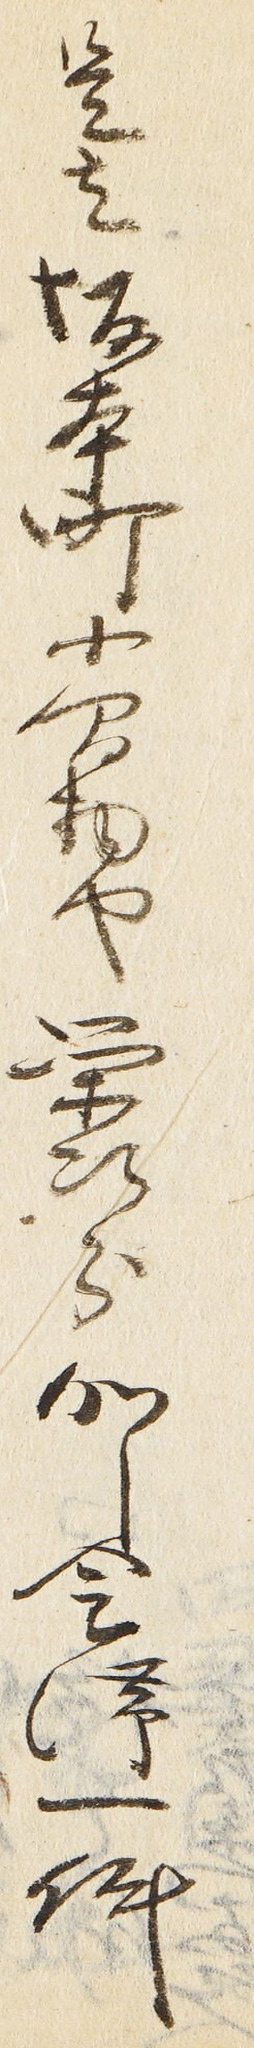是は坂本町小間物や栄次郎かし金滞一件
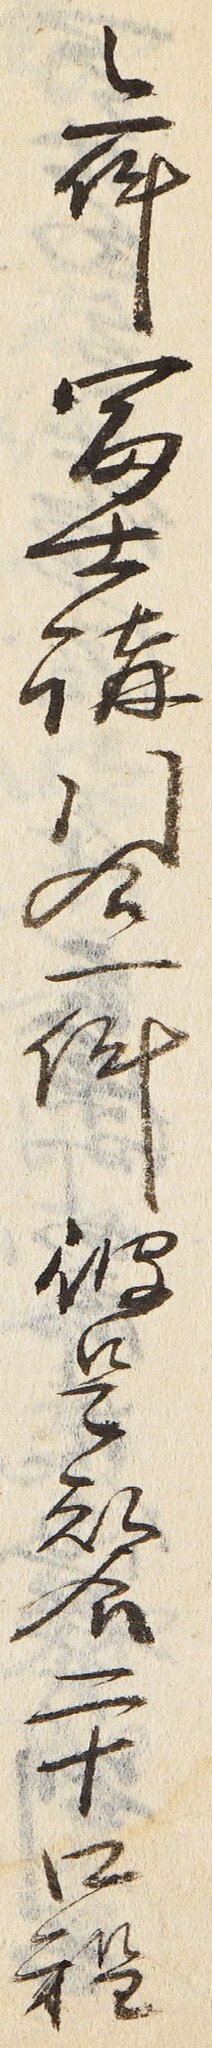之一件富士講引合一件彼是都合二十口程
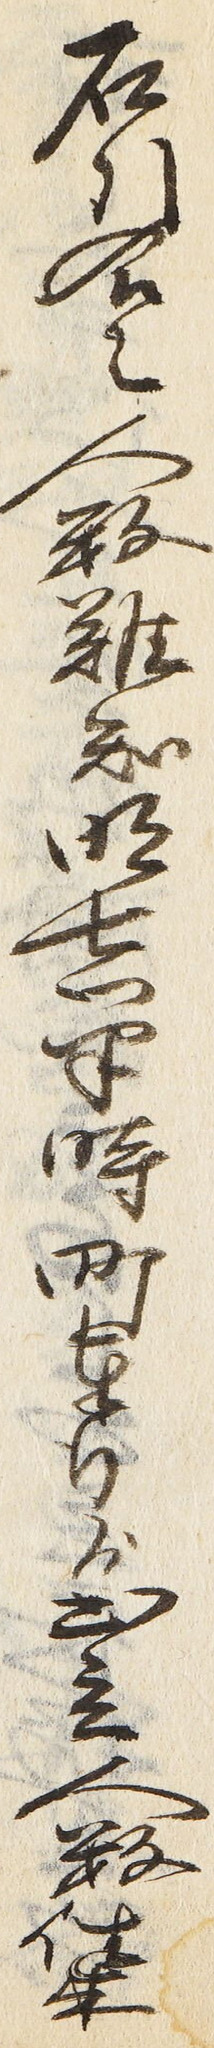右引合之人数難知明七ツ半時町奉行ゟ出立人数往来
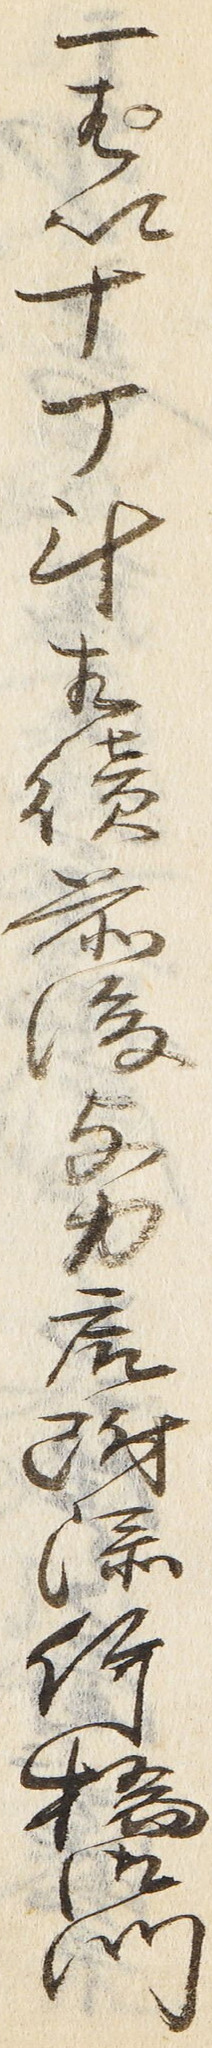一は以十丁計相続前後与力衆附添竹橋御門
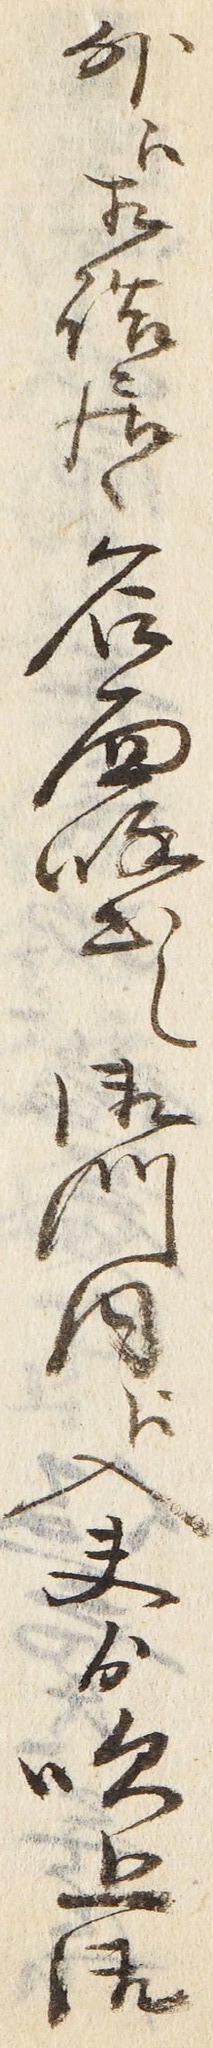外江相詰居候名面呼出し御門内江入夫ゟ吹上御
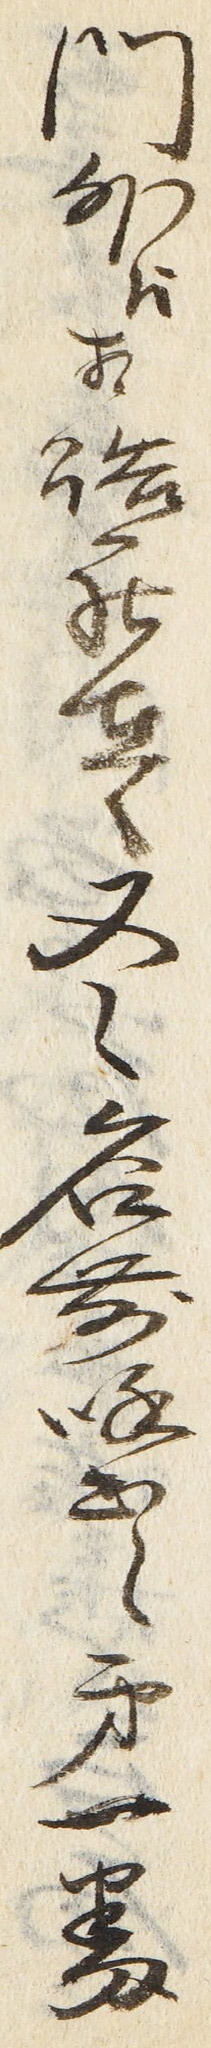門外江相詰罷在候又々名前呼出し第一番
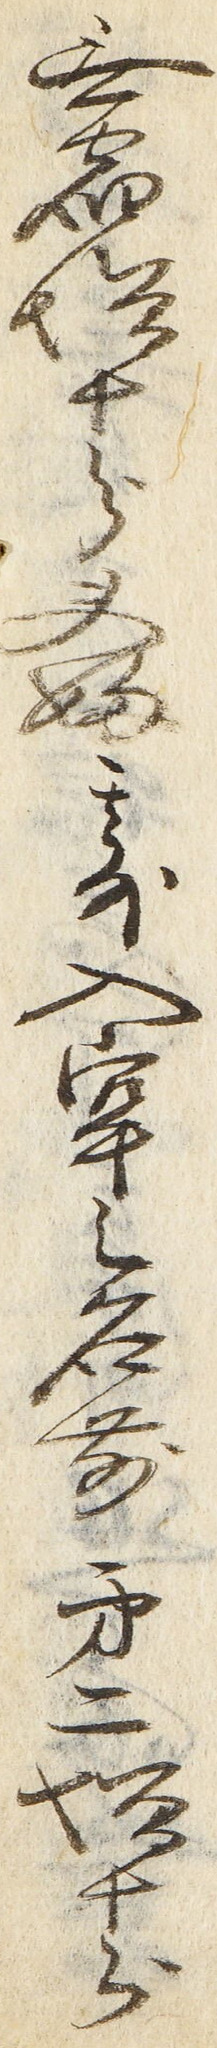無宿増十郎夫婦其外入牢之名前第二増十郎

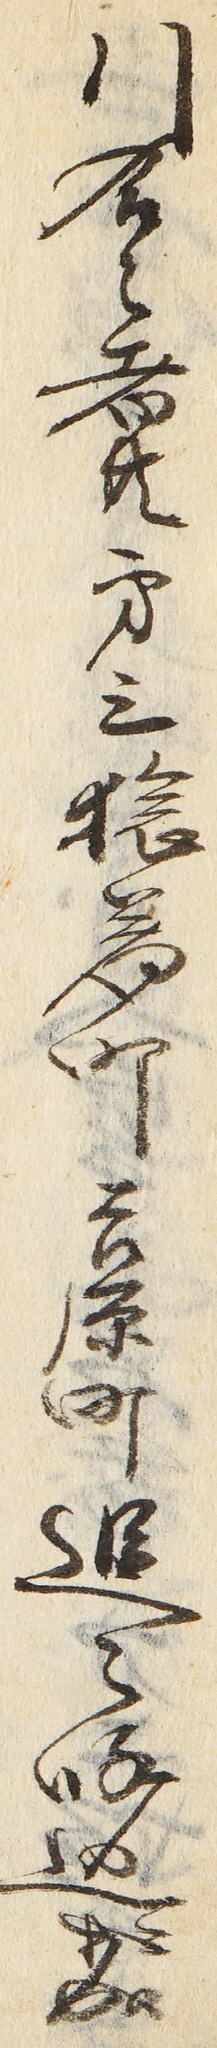引合之者共第三猿若町吉原町追々呼込に相成
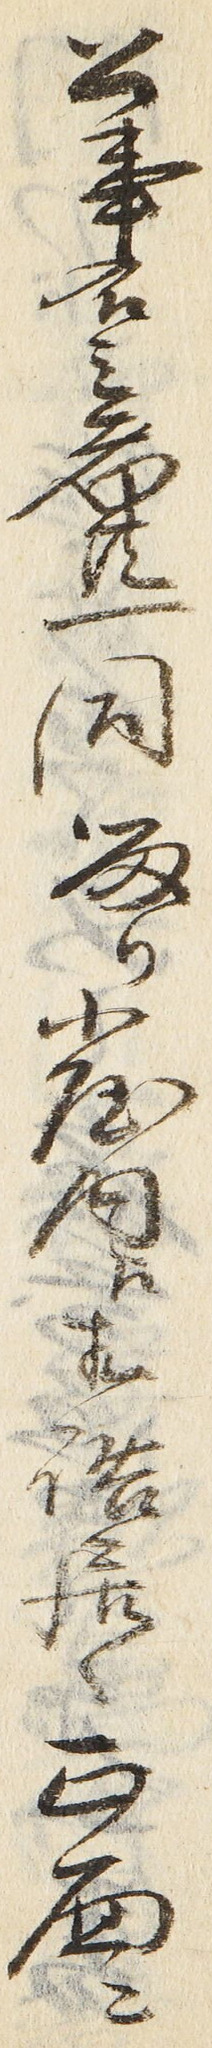公事合之者共一同留り小屋内江相詰居候正面に
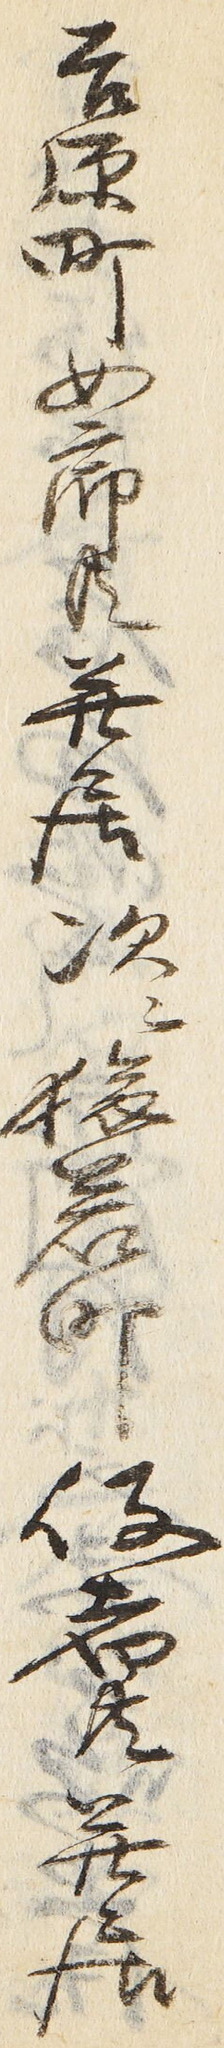吉原町女郎共并居次に猿若町役者共并居
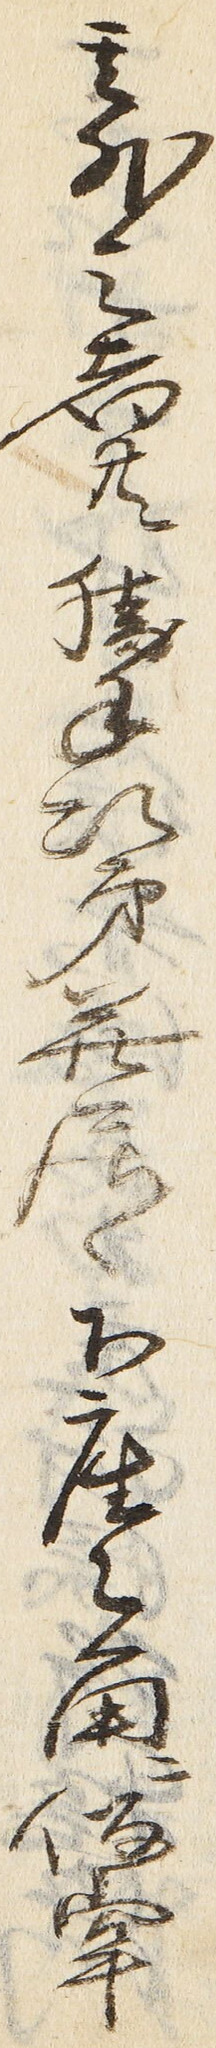其外之者共勝手次第并居候下座之角に仮牢
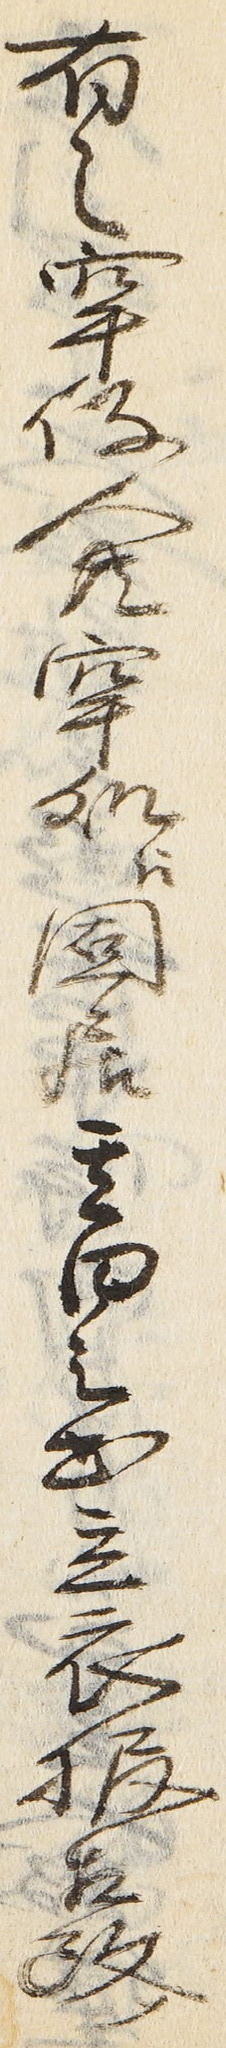有之牢役人共牢処江固居其日之出立衣服相改め
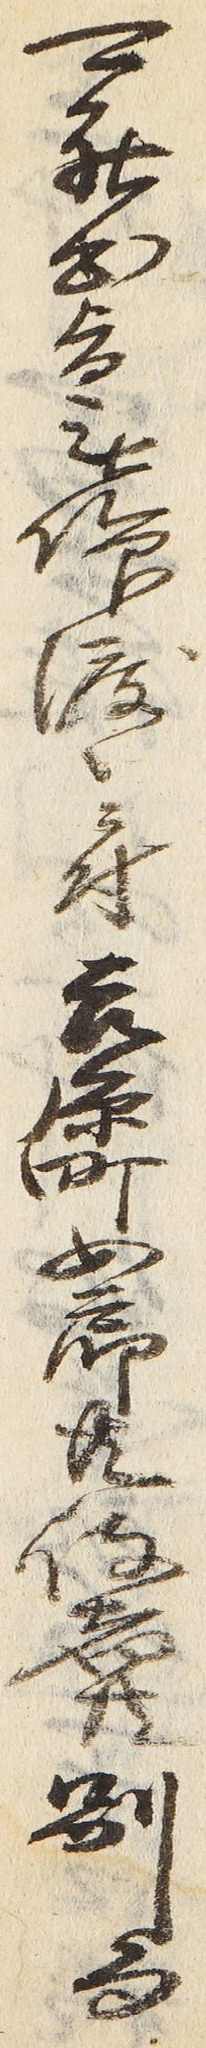可罷出旨被仰渡候に付吉原町女郎共役者共別而
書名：異流一件日記
